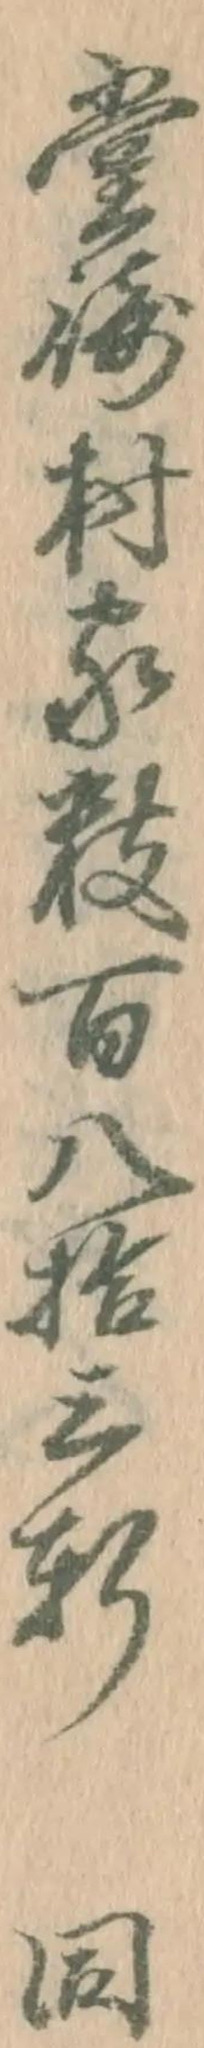堂崎村家数百八拾三軒同
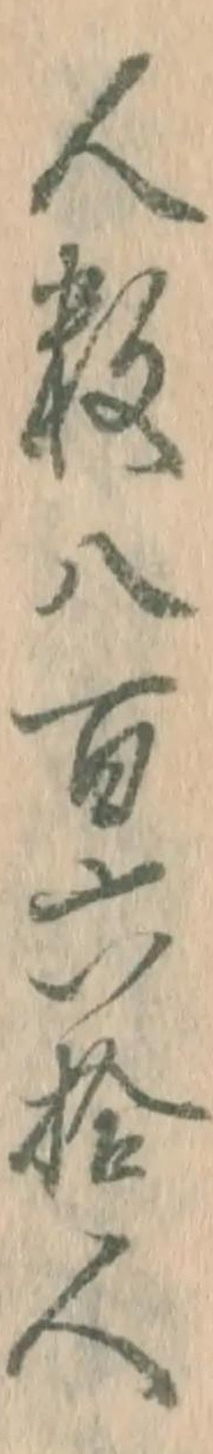人数八百六拾人同

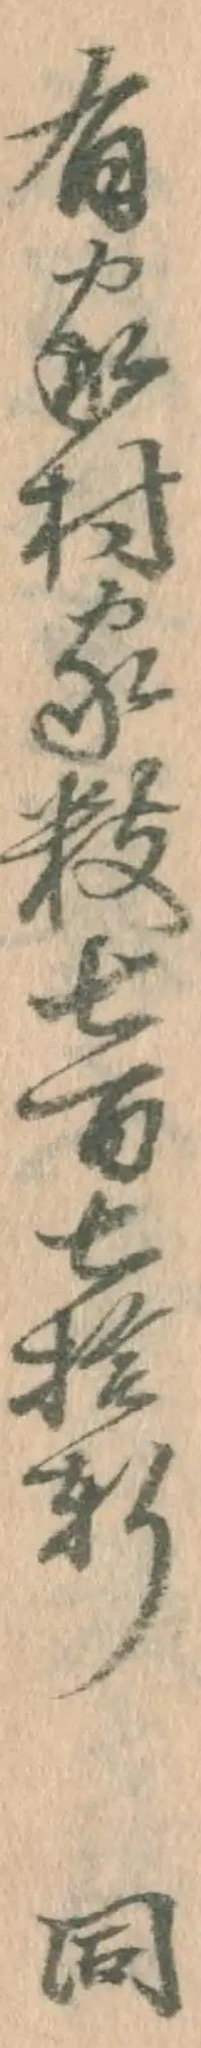有家村家数七百七拾軒同
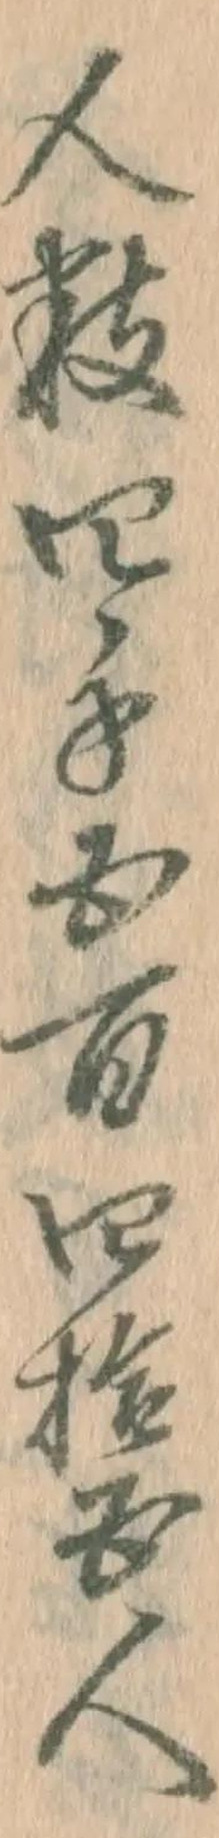人数四千五百四拾五人
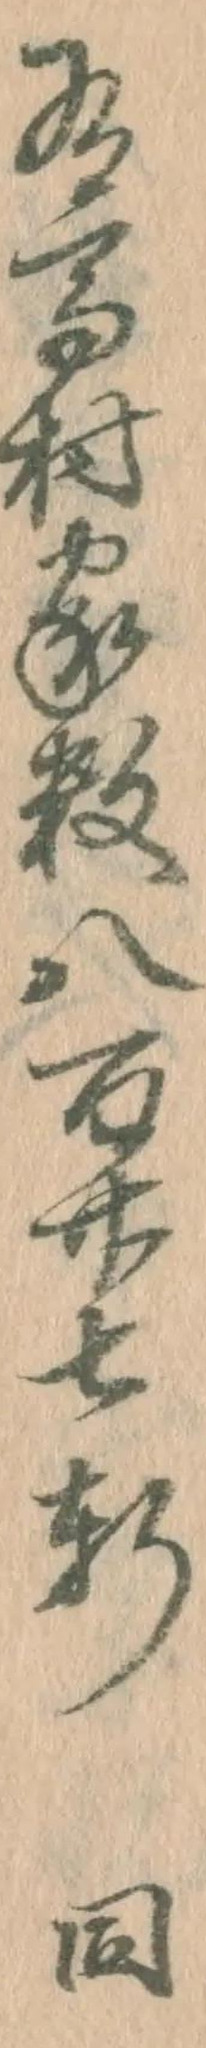有馬村家数八百廿七軒同
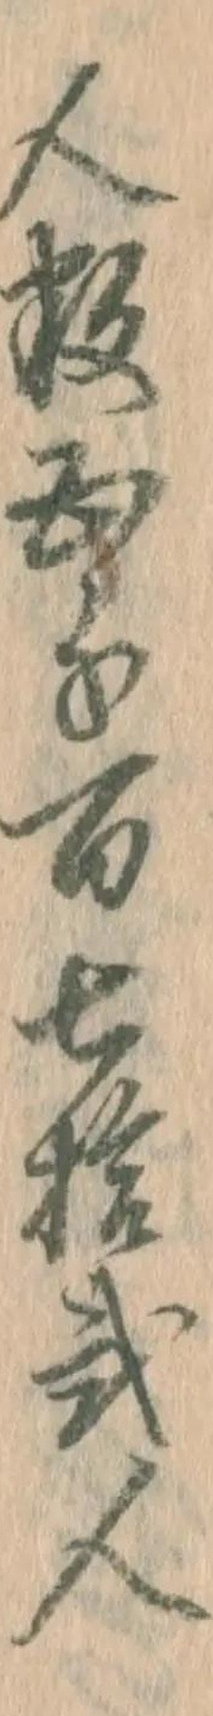人数弐千百七拾弐人
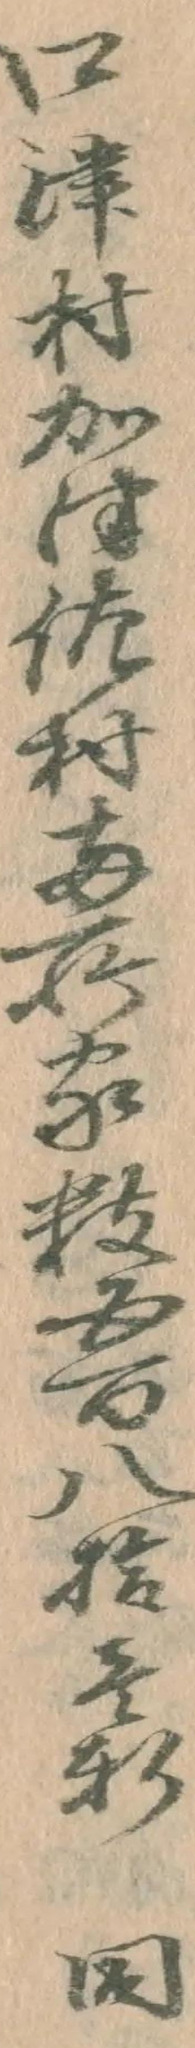口津村加津佐村両所家数五百八拾壱軒同
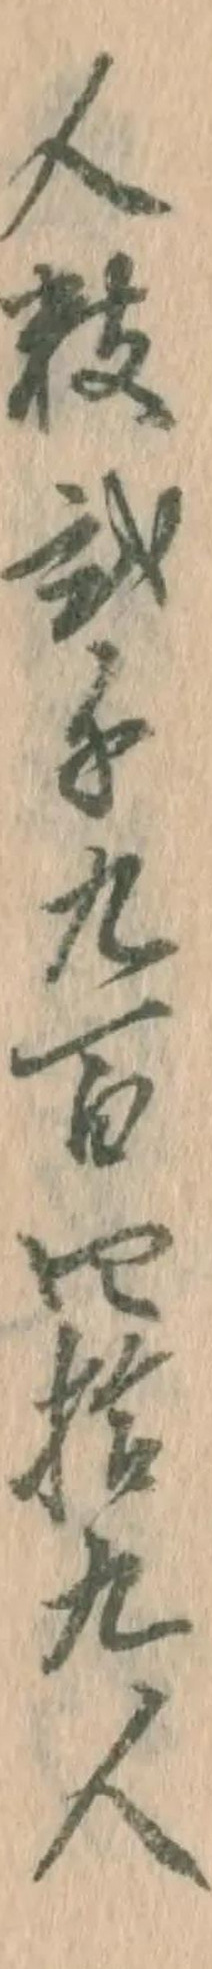人数弐千九百四拾九人
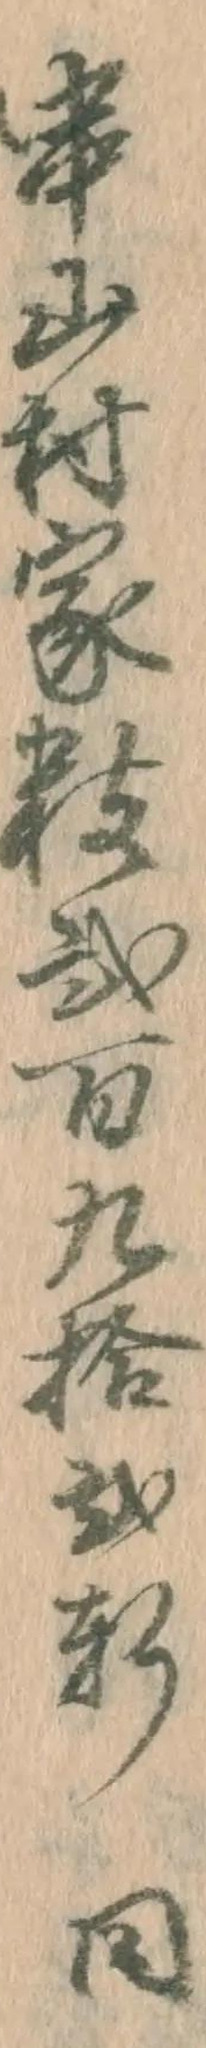串山村家数弐百九拾弐軒同
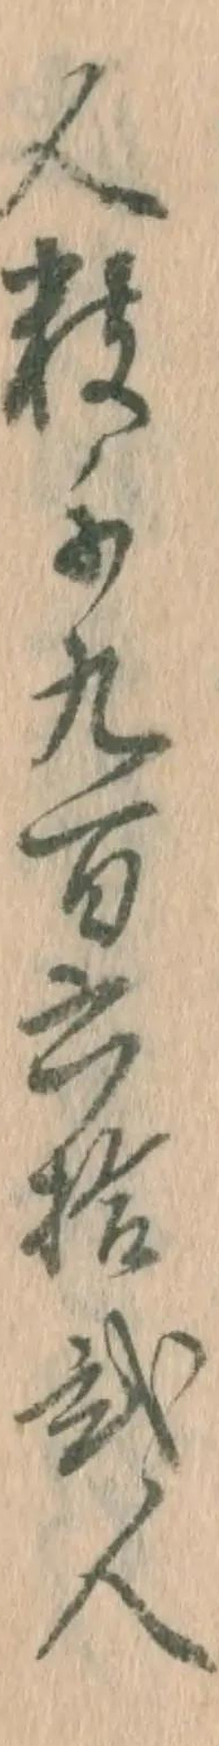人数千九百六拾弐人
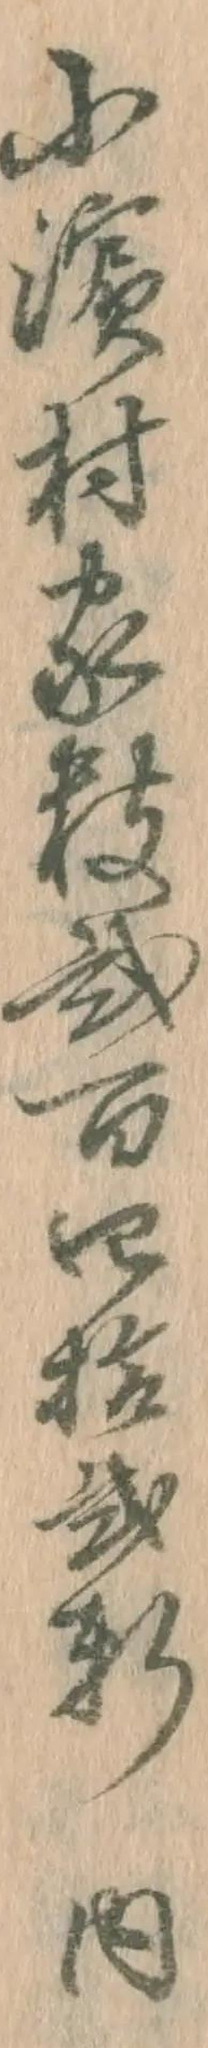串山村家数弐百九拾弐軒同
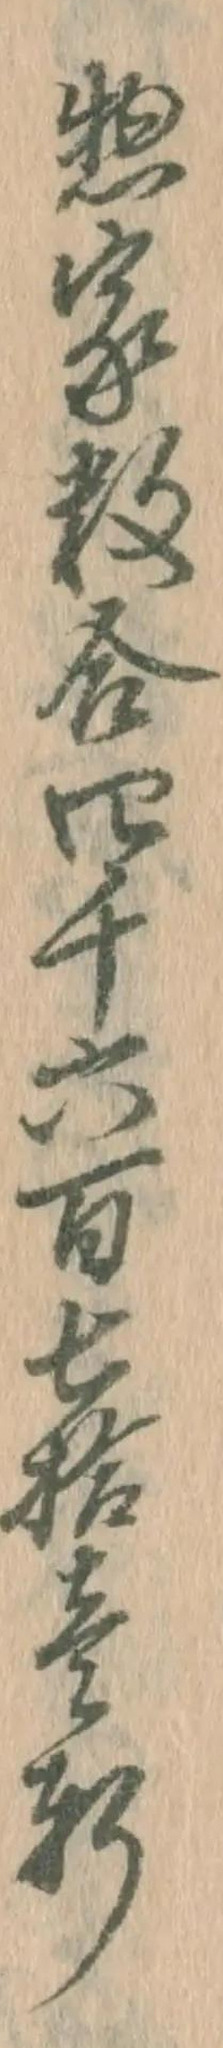惣家数合四千六百七拾壱軒
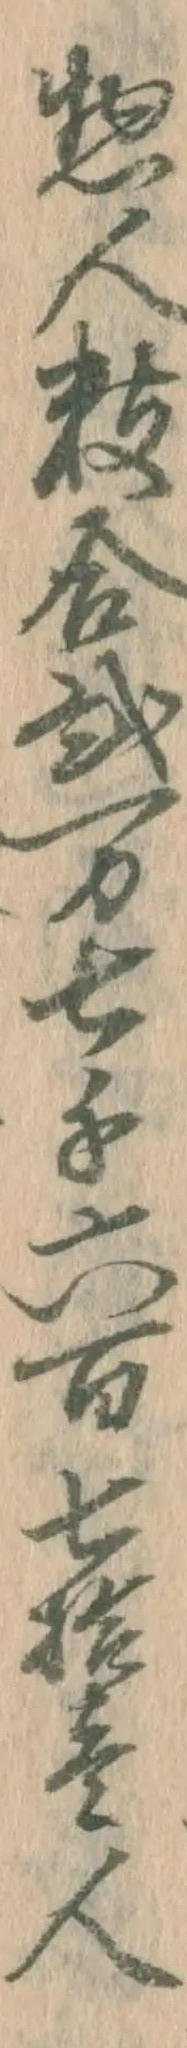惣人数合弐万七千六百七拾壱人
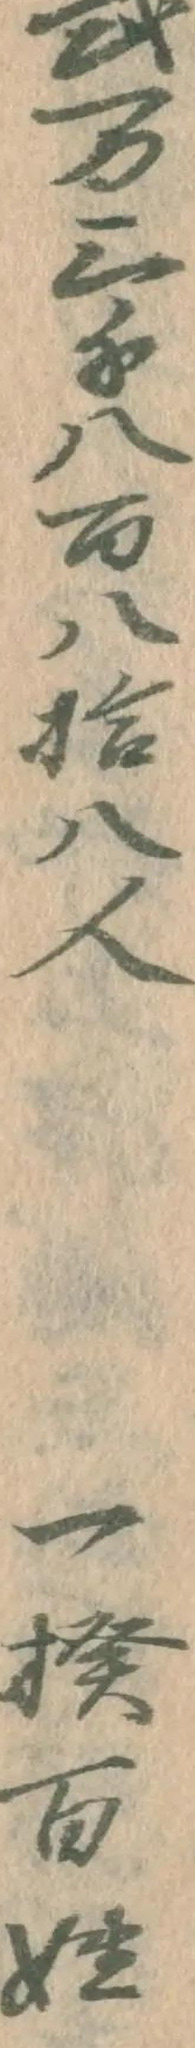弐万三千八百八拾八人一揆百姓
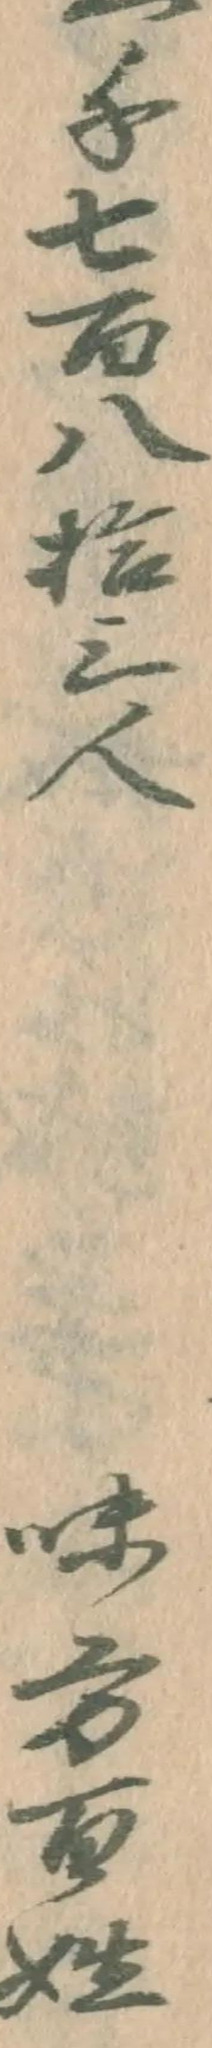三千七百八拾三人味方百姓

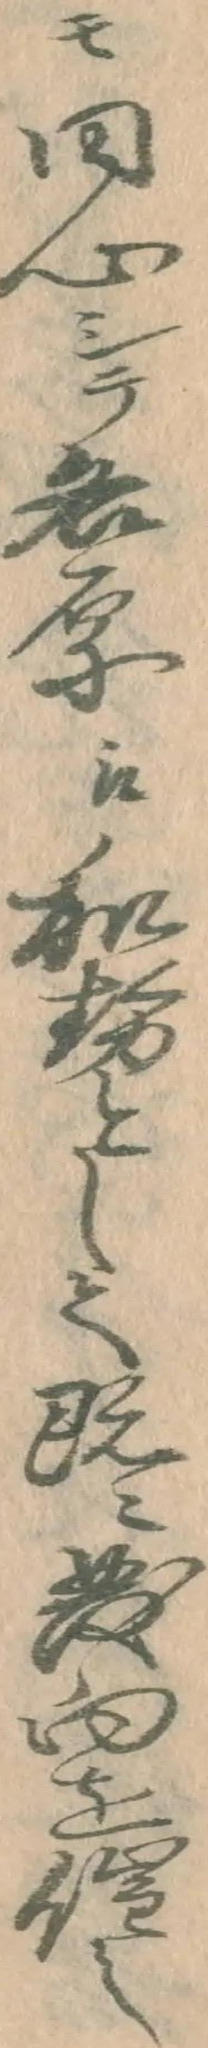も用心して各原江加勢として既に慶向を催し
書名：切支丹御退治記 49巻. [4]
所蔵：国立国会図書館 National Diet Library, JAPAN
